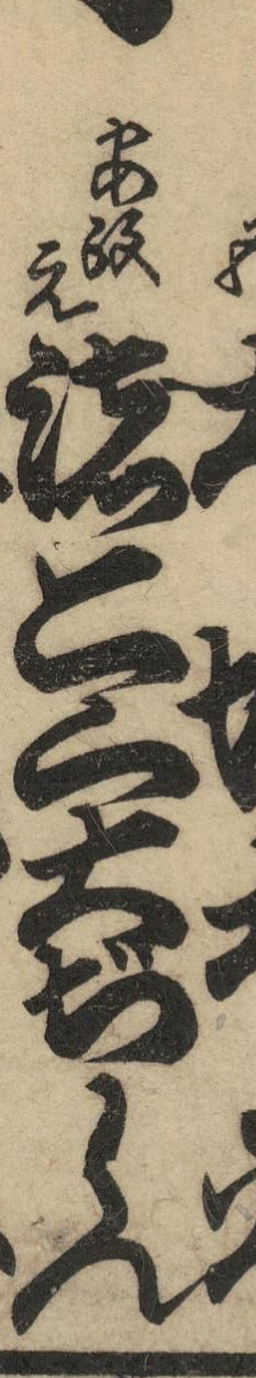同安政元諸こく大ぢしん
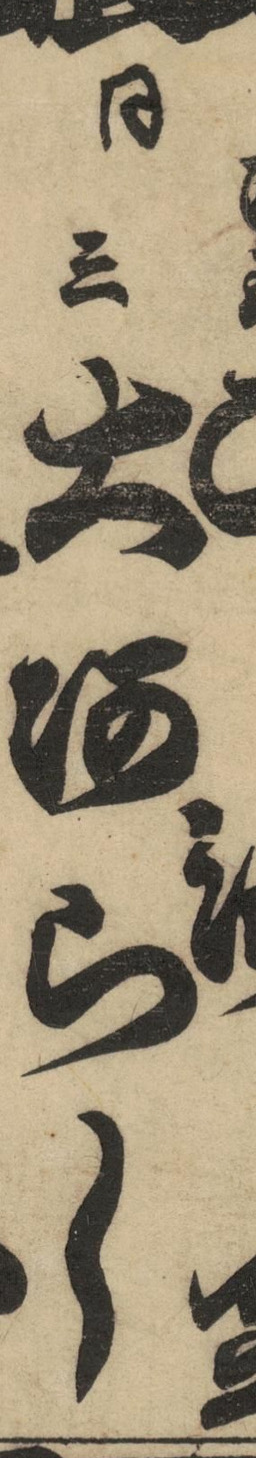津浪同三大あらし
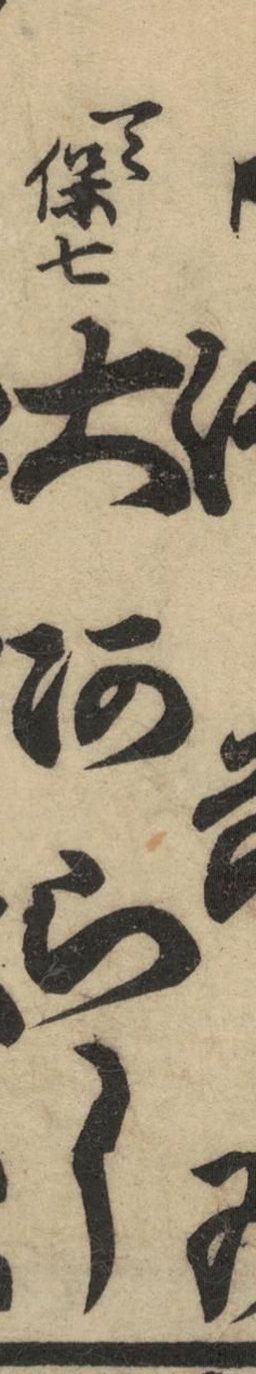同天保七大あらし
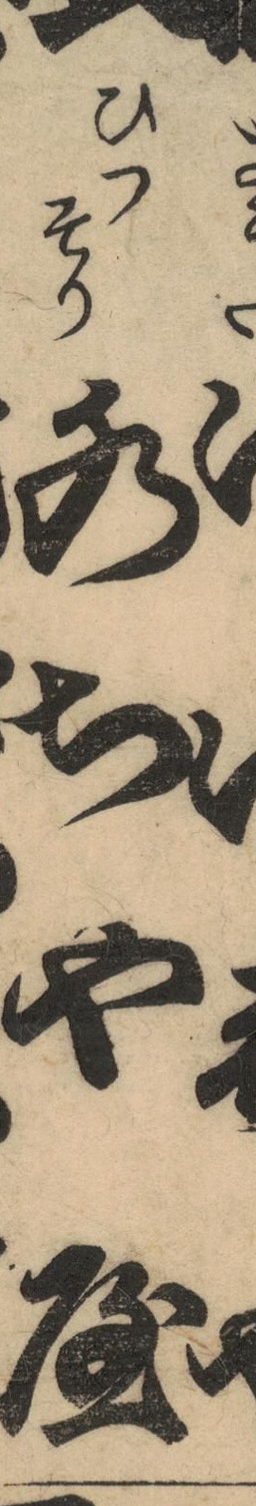不喰ひつそり水ちや屋
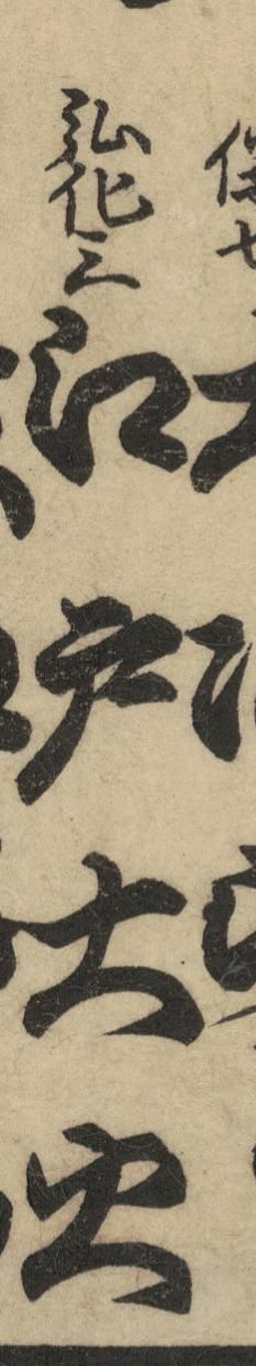同弘化三江戸大火
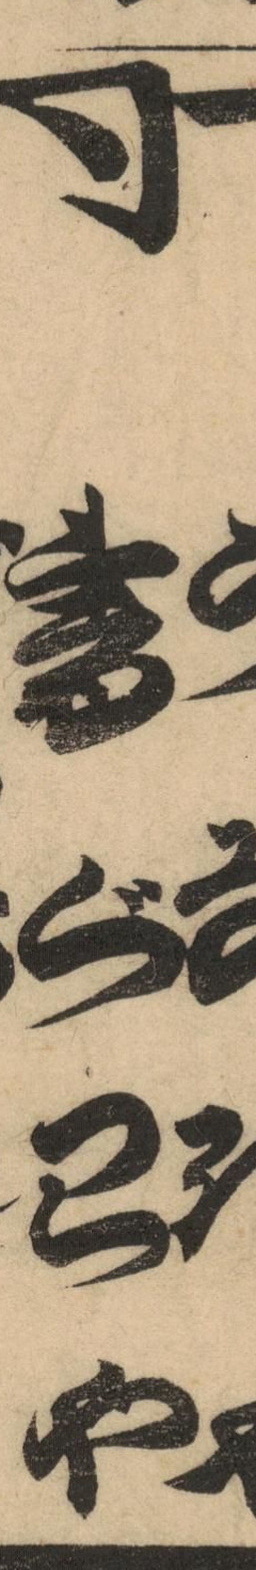同書ぐわや
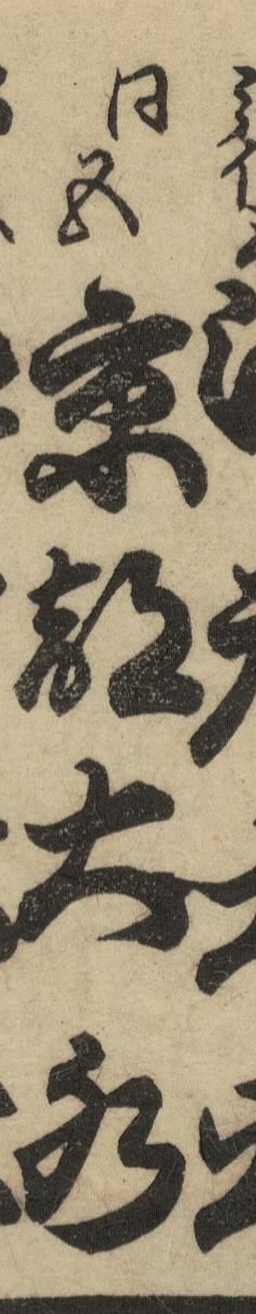同同五京都大水
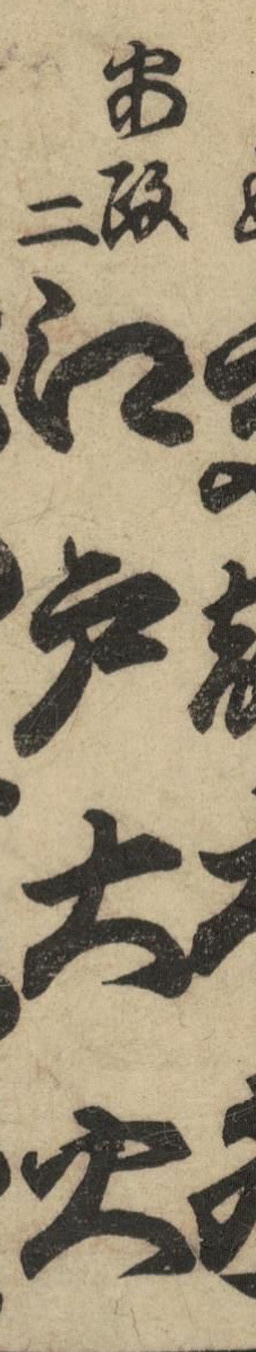同安政二江戸大火
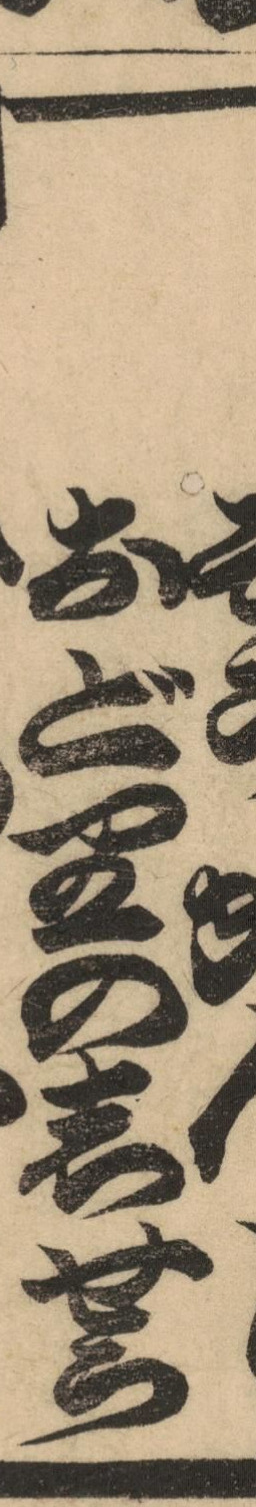同おどりのしせう
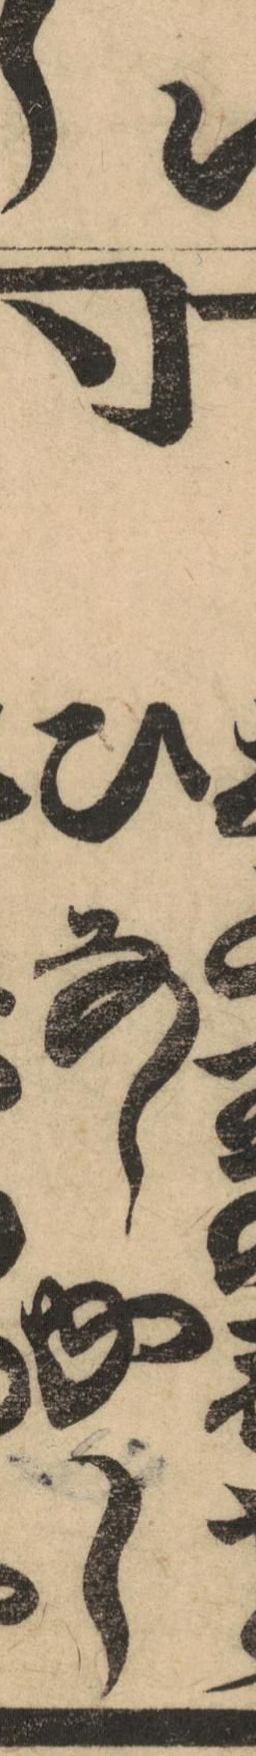同ひなしかし
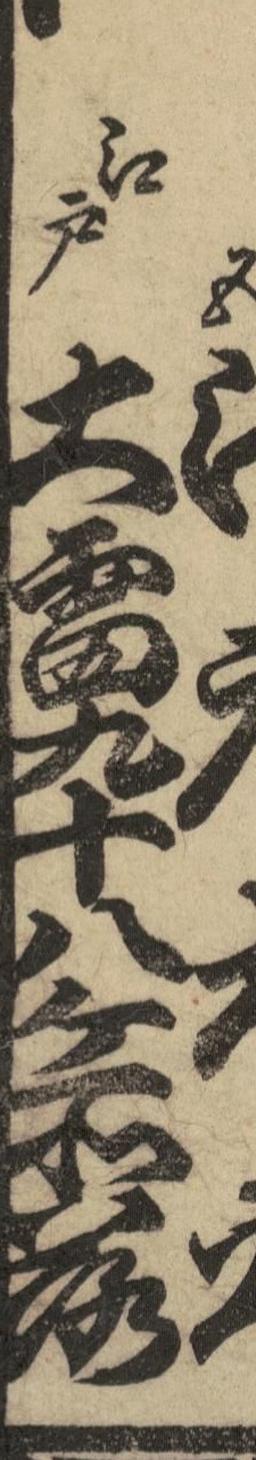同江戸大雷九十八ケ所落
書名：大悦大變競・盛衰競
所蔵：東京大学地震研究所図書室 Earthquake Research Institute Library, The University of Tokyo, JAPAN
